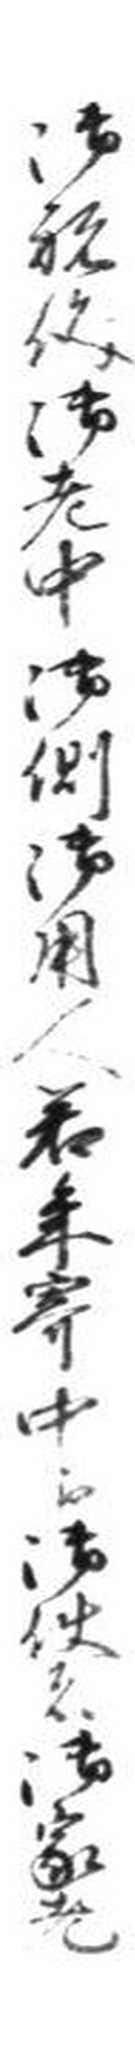御祝儀御老中御側御用人若年寄中江御使者御家老
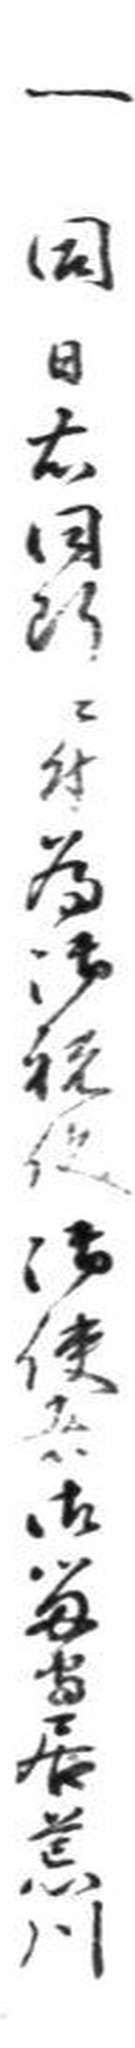一同日右同断ニ付為御祝儀御使者御留守居荒川
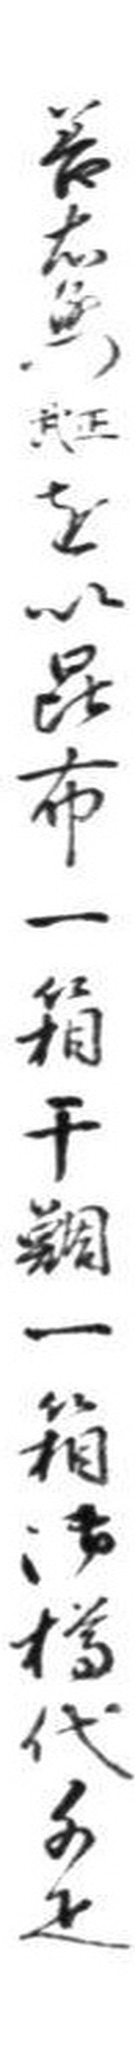善右衛門正武を以昆布一箱干鯛一箱御樽代千疋
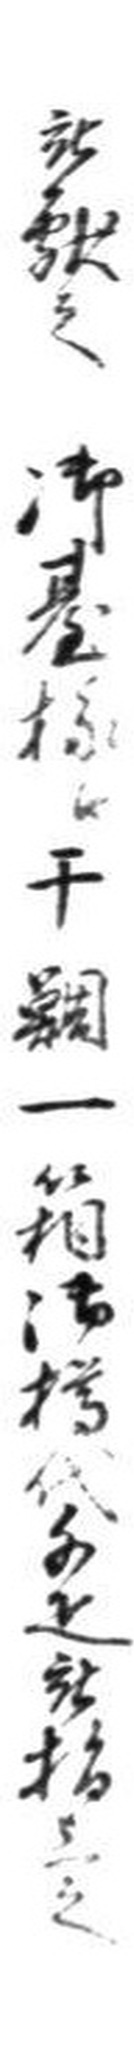被献之御台様江干鯛一箱御樽代千疋被指上之
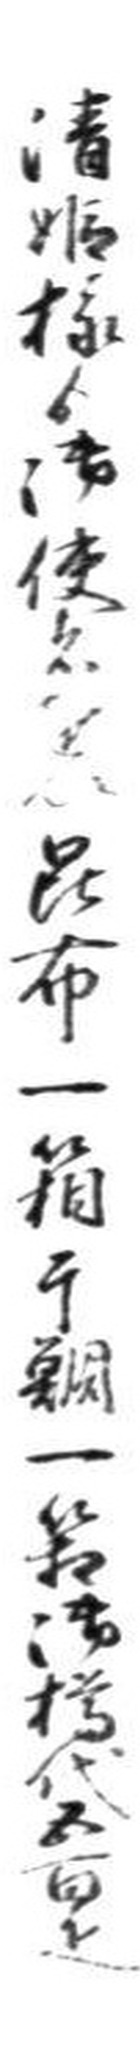清姫様ゟ御使者を以昆布一箱干鯛一箱御樽代五百疋
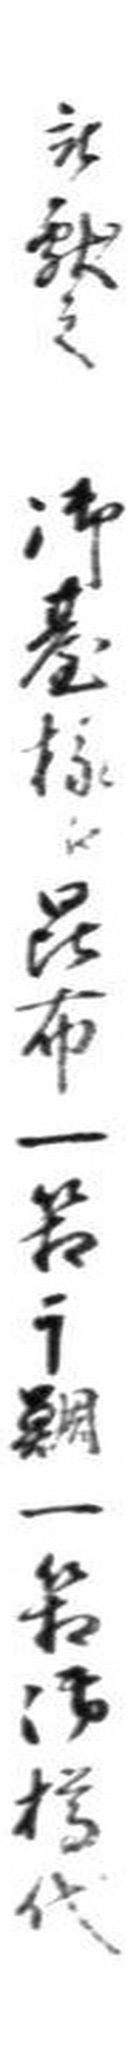被献之御台様江昆布一箱干鯛一箱御樽代
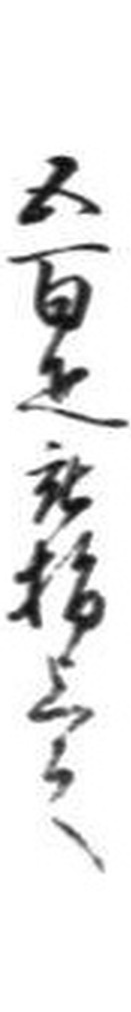五百疋被指上之
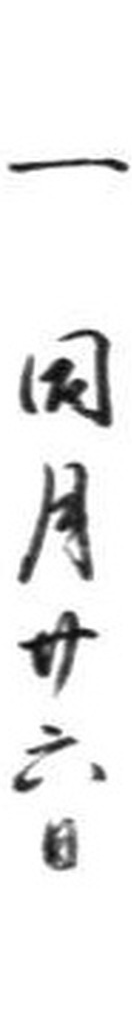一同月廿六日
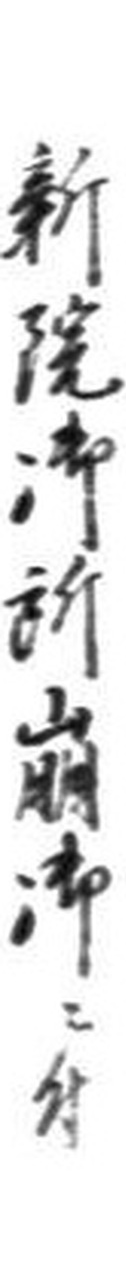新院御所崩御ニ付
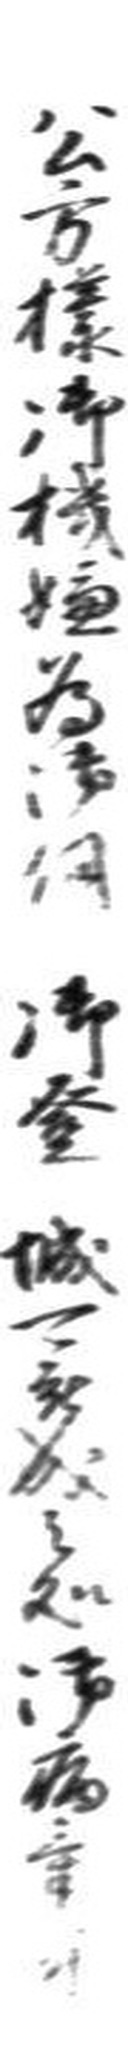公方様御機嫌為御伺御登城可被成之処御病気ニ付
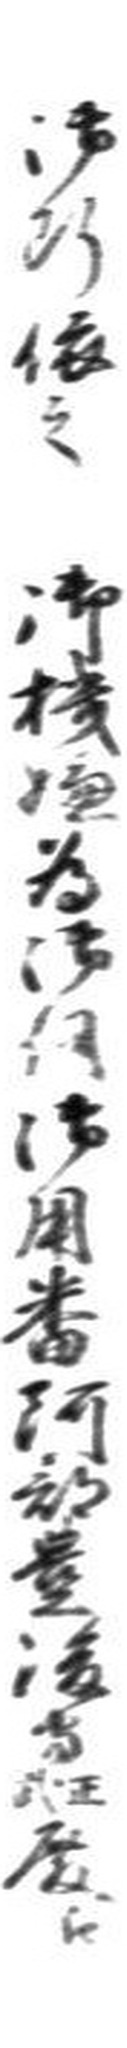御断依之御機嫌為御伺御用番阿部豊後守正武殿江
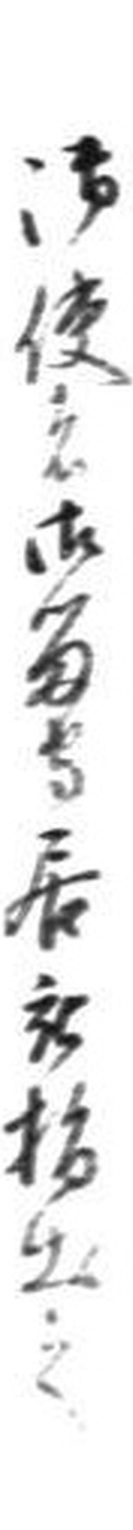御使者御留守居被指出之
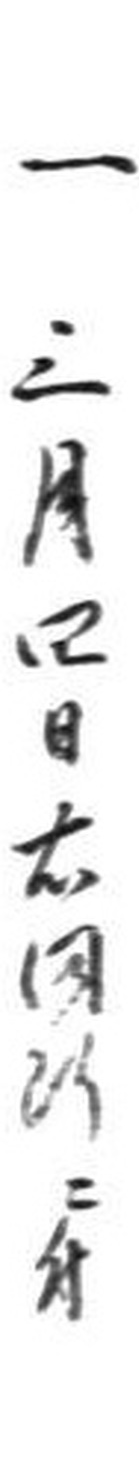一三月四日右同断ニ付
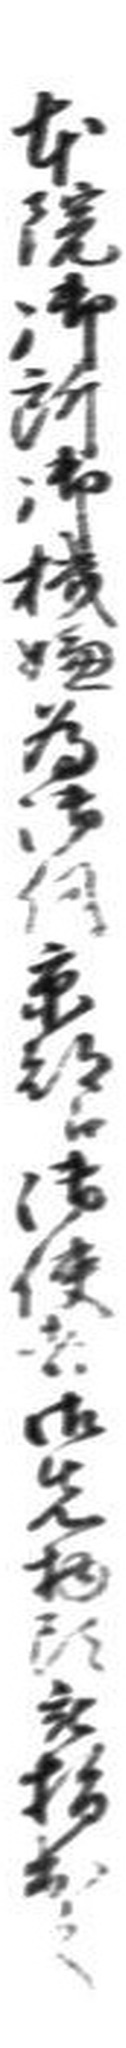本院御所御機嫌為御伺京都江御使者御先物頭被指出之

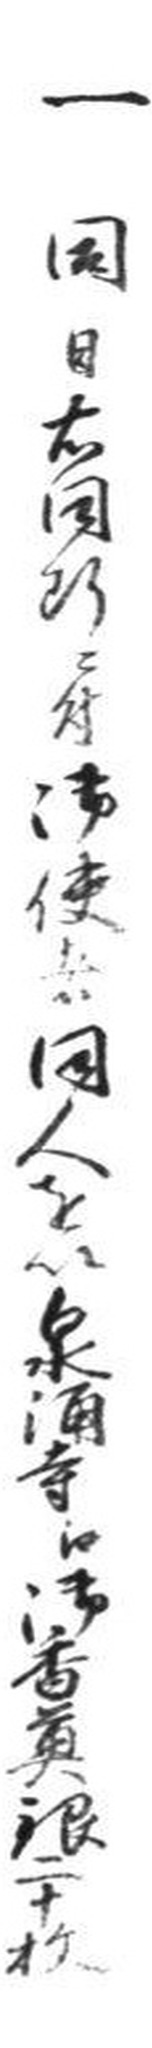一同日右同断ニ付御使者同人を以泉涌寺江御香奠銀二十枚
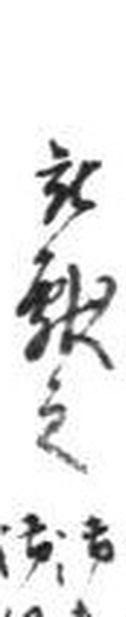被献之
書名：家譜 十五 綱昌公 従天和元年到元禄十二年
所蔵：福井県文書館 Fukui Prefectural Archives
